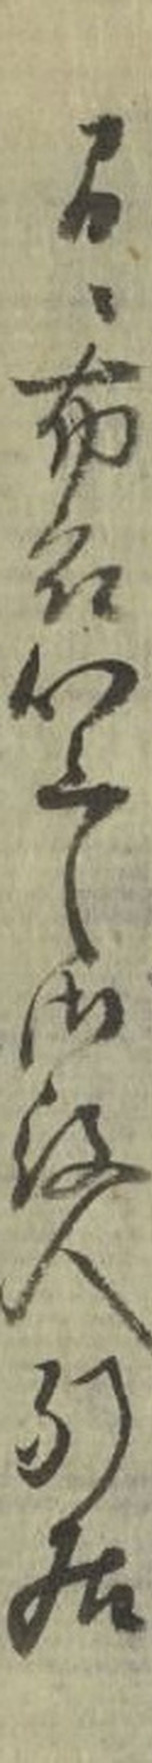間に布衣以上之御役人列居
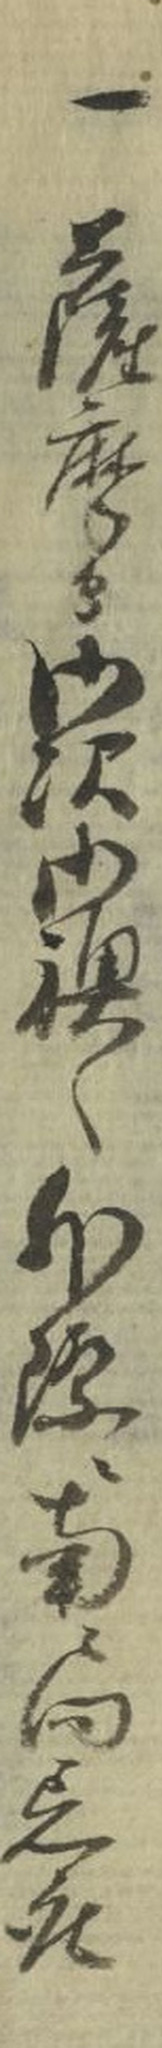一薩摩守御次御襖之外際に南に向着座
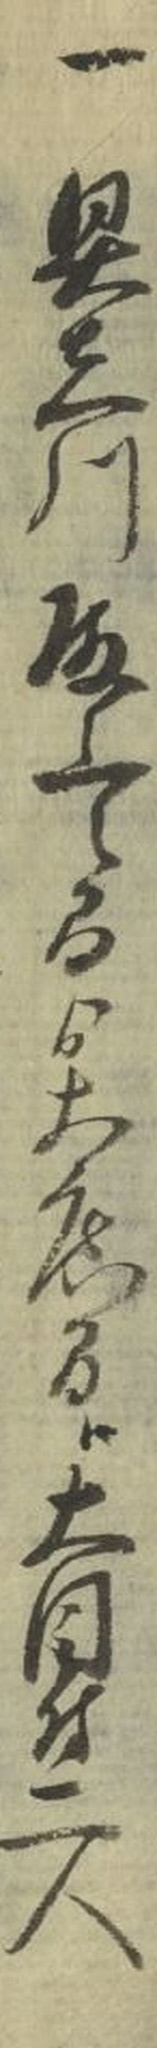一具志川殿上之間ゟ大広間え大目付二人
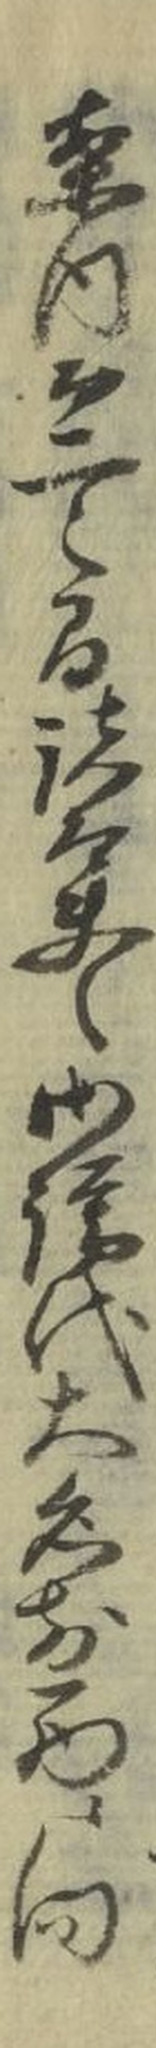案内而二之間諸大夫之御譜代大名前西に向
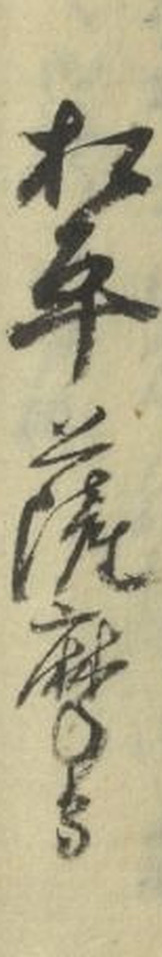松平薩摩守
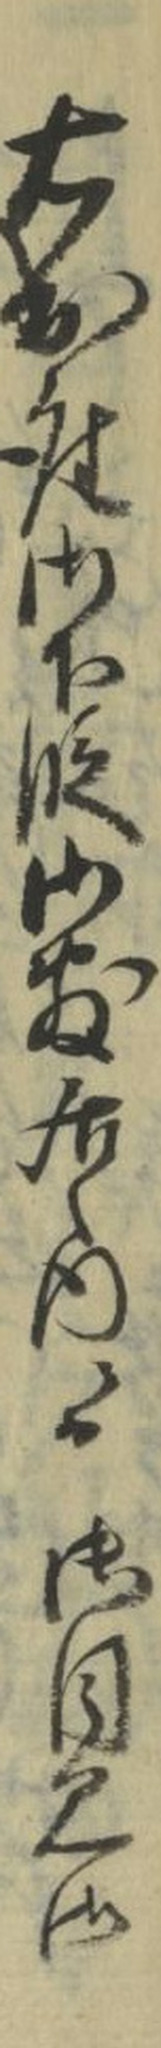右出座御下段御敷居之内にて御目見御
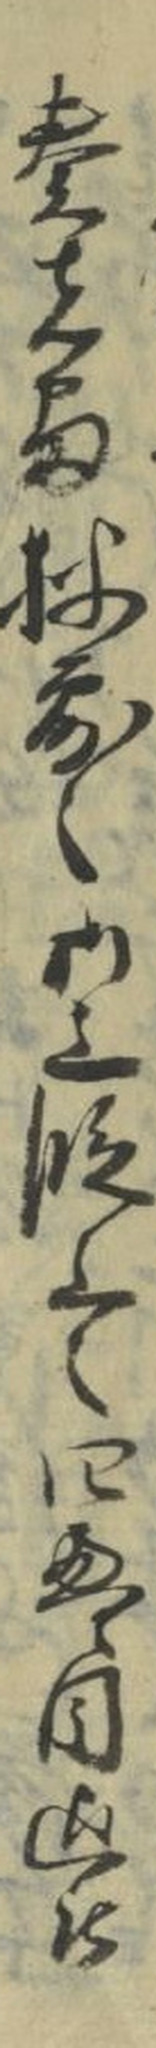奏者番披露之御上段上之四畳目迄被
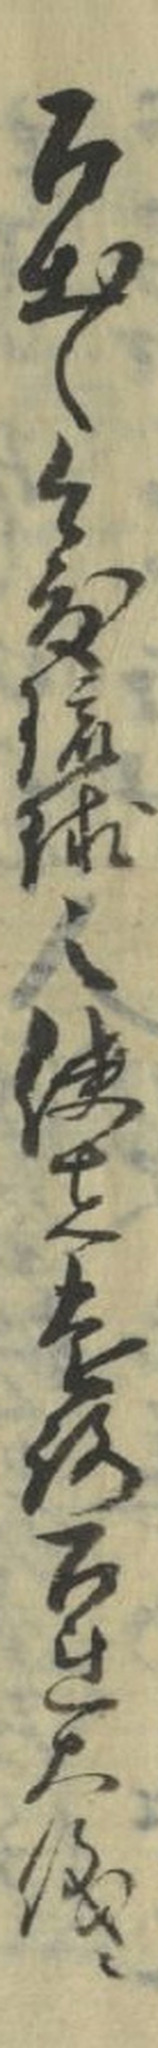召出之今度琉球之使者遠路召連大儀に
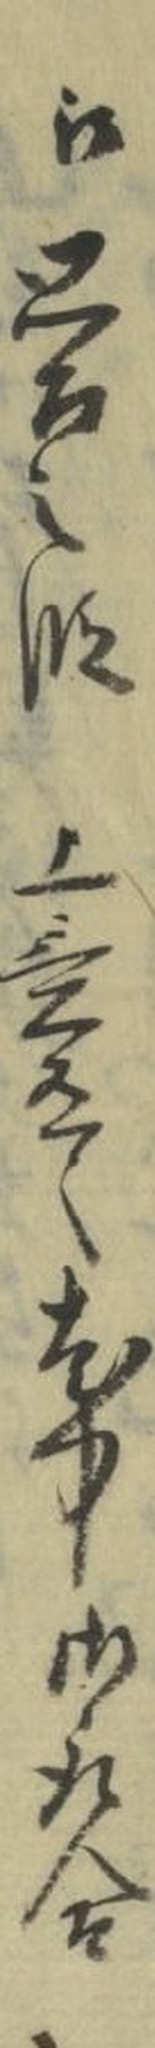被思召之段上意有之老中御取合
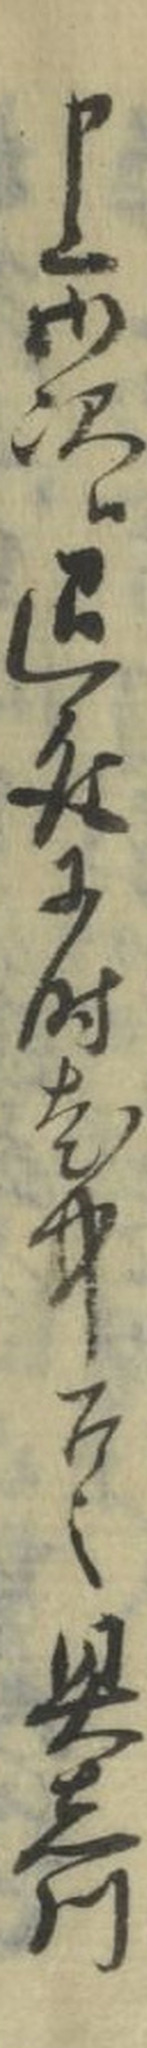申上御次え退座于時老中召之具志川
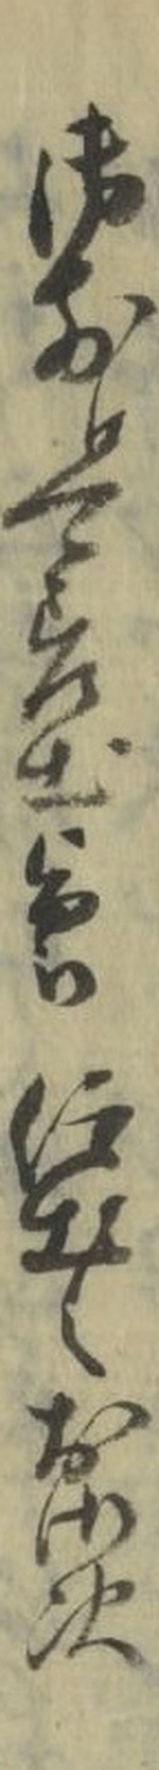御前え可差出旨被仰出之於御次
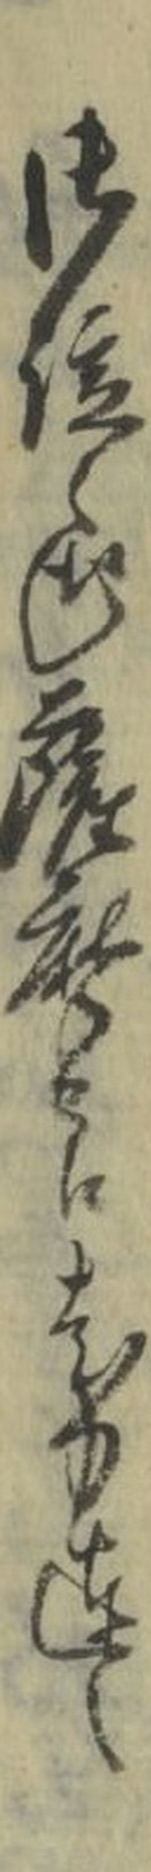御諚之趣薩摩守え老中達之
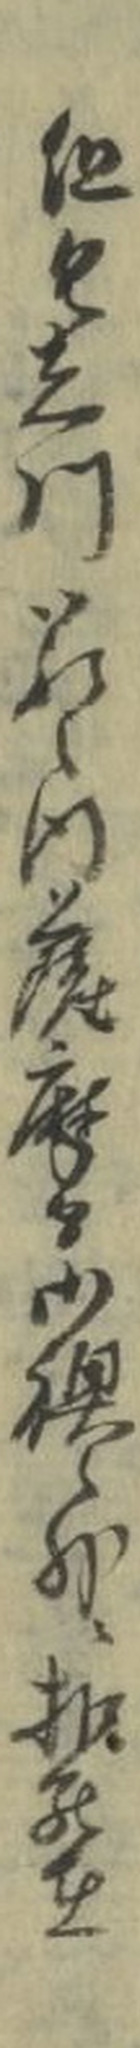但具志川御礼之内薩摩守御襖之外に扣罷在
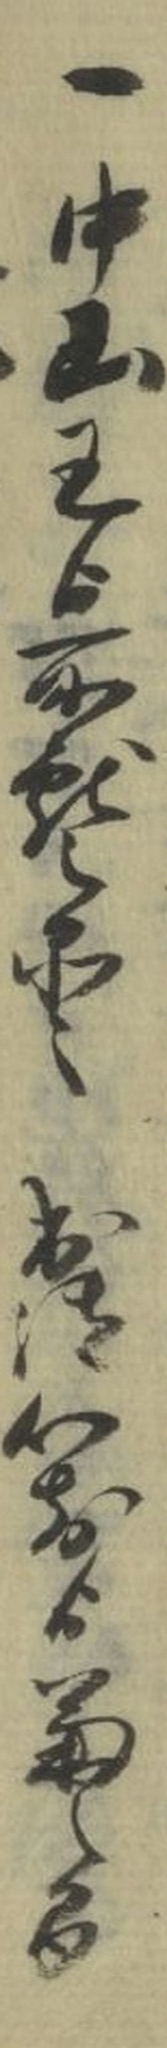一中山王ゟ所献之品々出御以前ゟ菊之間
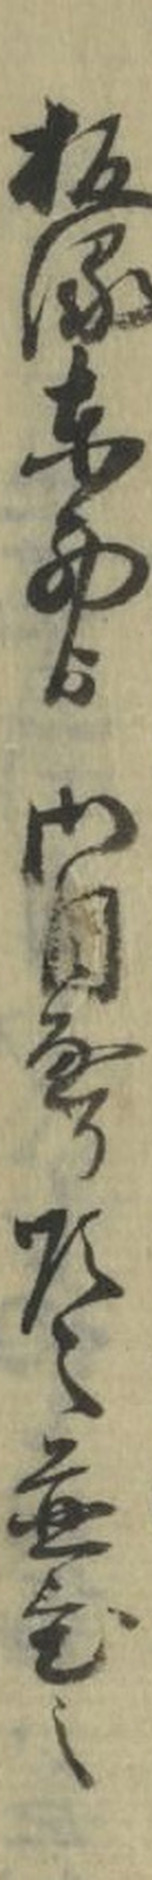板縁東西ゟ御目通り順々並置之

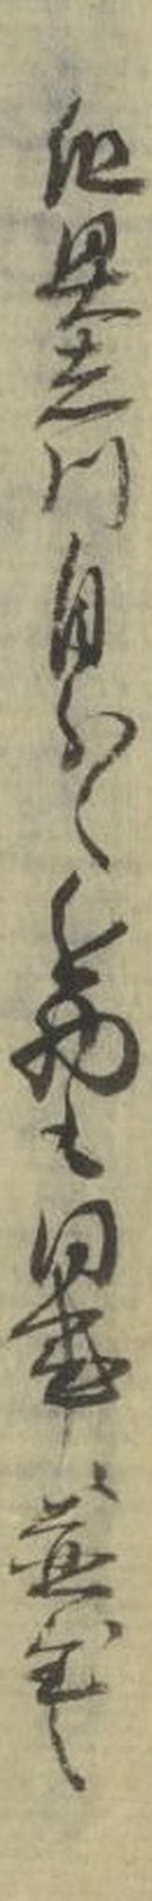但具志川自分之進物も同事に並置之
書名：戊辰琉球人来朝之式 全
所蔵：University of the Ryukyus Library
